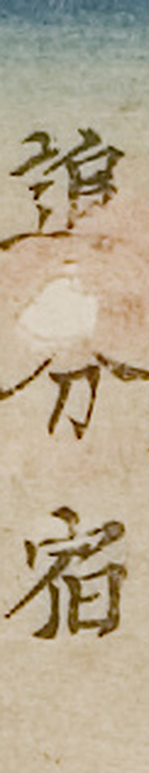追分宿
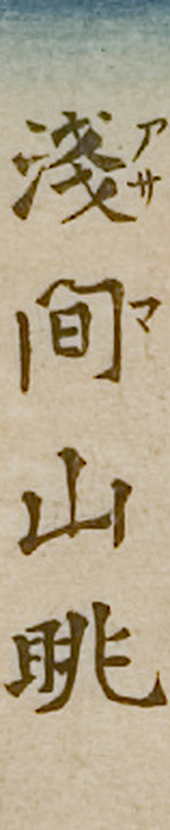浅間山眺
